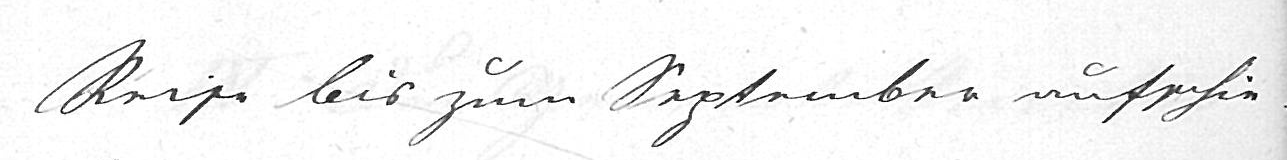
Reise bis zum September aufschie-
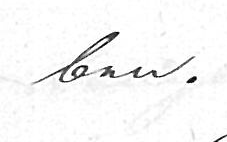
ben.
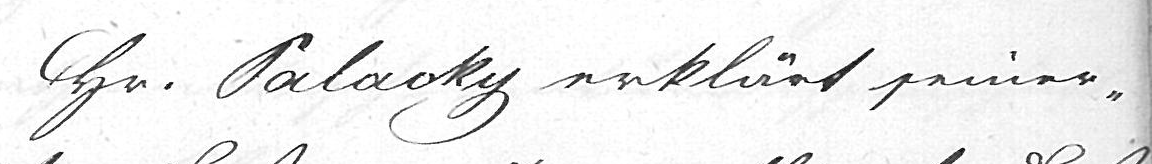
Hr. Palacky erklärt seiner-
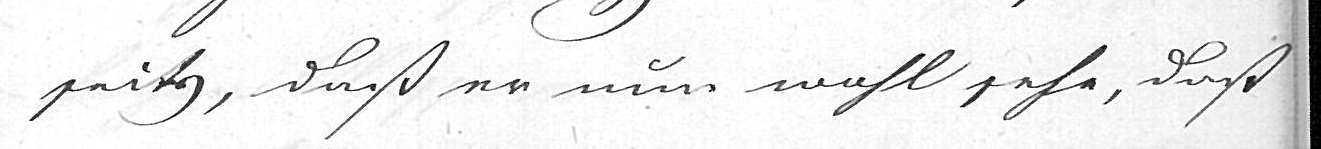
seits, daß er nun wohl sehe, daß
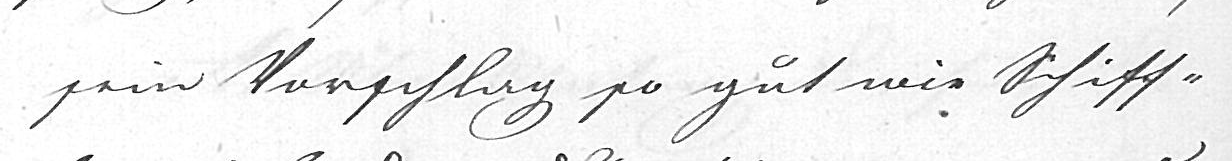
sein Vorschlag so gut wie Schiff-
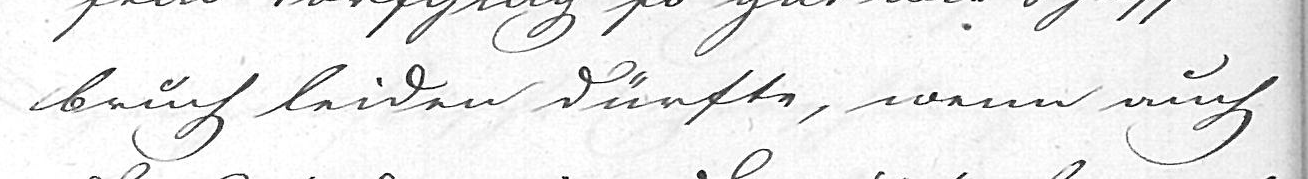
bruche leiden dürfte, wenn auch
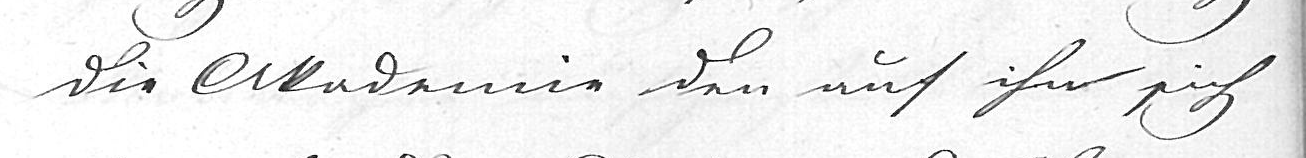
die Akademie den auf ihn sich
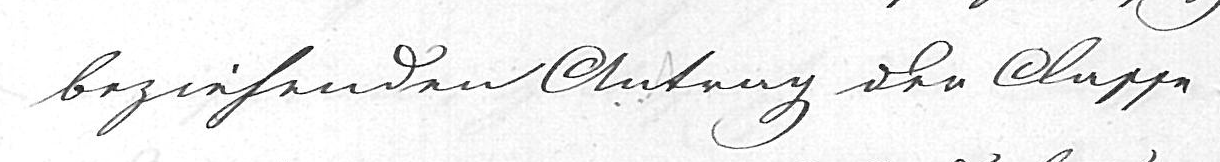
beziehenden Antrag der Classe
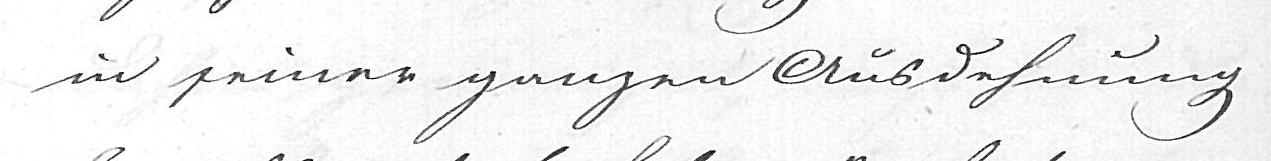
in seiner ganzen Ausdehnung
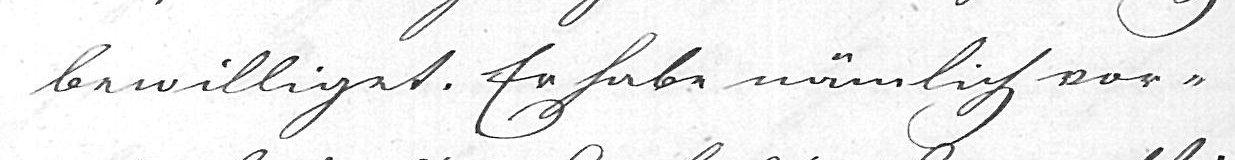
bewilliget. Er habe nämlich vor-
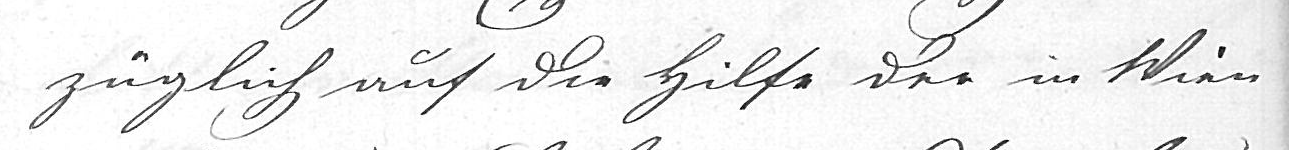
züglich auf die Hilfe der in Wien
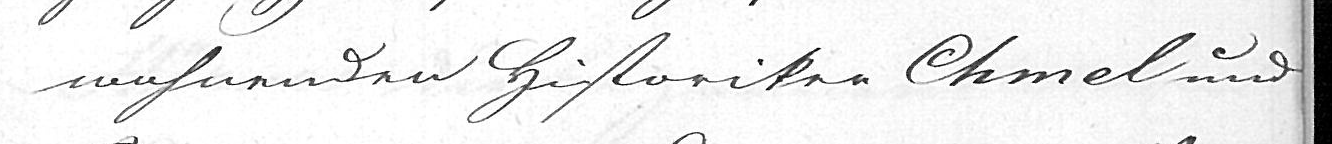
wohnenden Historiker Chmel und
